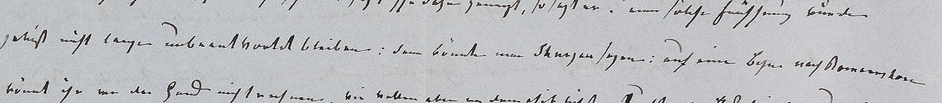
gewiß nicht lange unbeantwortet bleiben: dann könnte man Thurgau sagen: auf eine Bahn nach Romanshorn
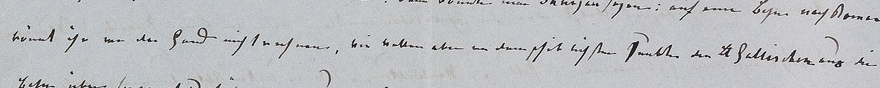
könnt ihr vor der Hand nicht rechnen, wir wollen aber von dem schiklichsten Punkte des St Gallischen aus die
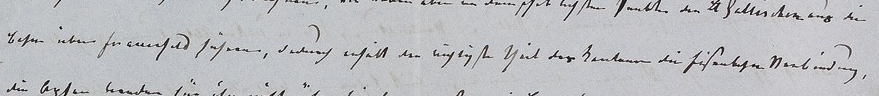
Bahn über Frauenfeld führen, dadurch erhält der wichtigste Theil des Kantons die Eisenbahn Verbindung,
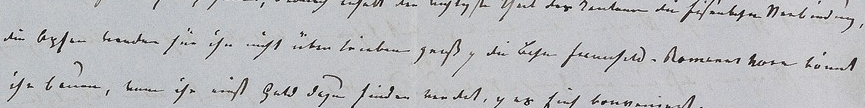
die Opfer werden für ihn nicht übertrieben groß & die Bahn Frauenfeld –Romanshorn könnt
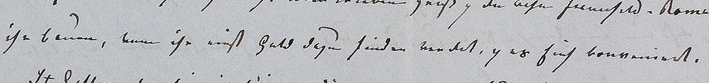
ihr bauen, wenn ihr einst Geld dazu finden werdet, & es Euch konveniert.
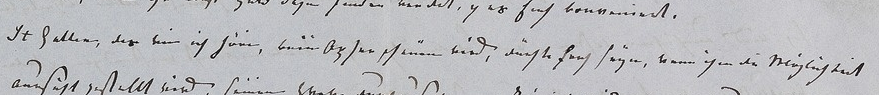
St Gallen, das wie ich höre, keine Opfer scheuen wird, dürfte froh seyn, wenn ihm die Möglichkeit
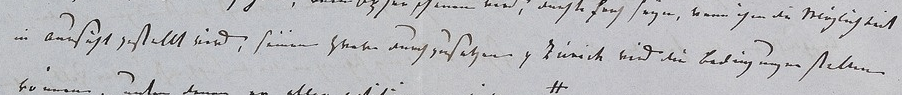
in Aussicht gestellt wird, seinen Zwek durchzusetzen & Zürich wird die Bedingungen stellen
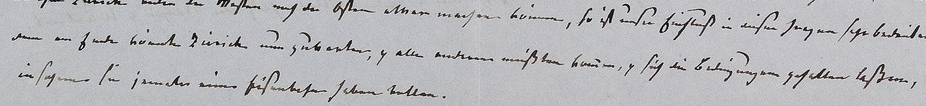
denn am Ende könnte Zürich nun zuwarten, & alle anderen müßten kommen, & sich die Bedingungen gefallen laßen,
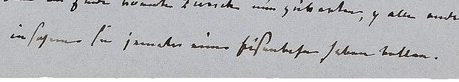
in sofern sie jemals eine Eisenbahn haben wollen.
